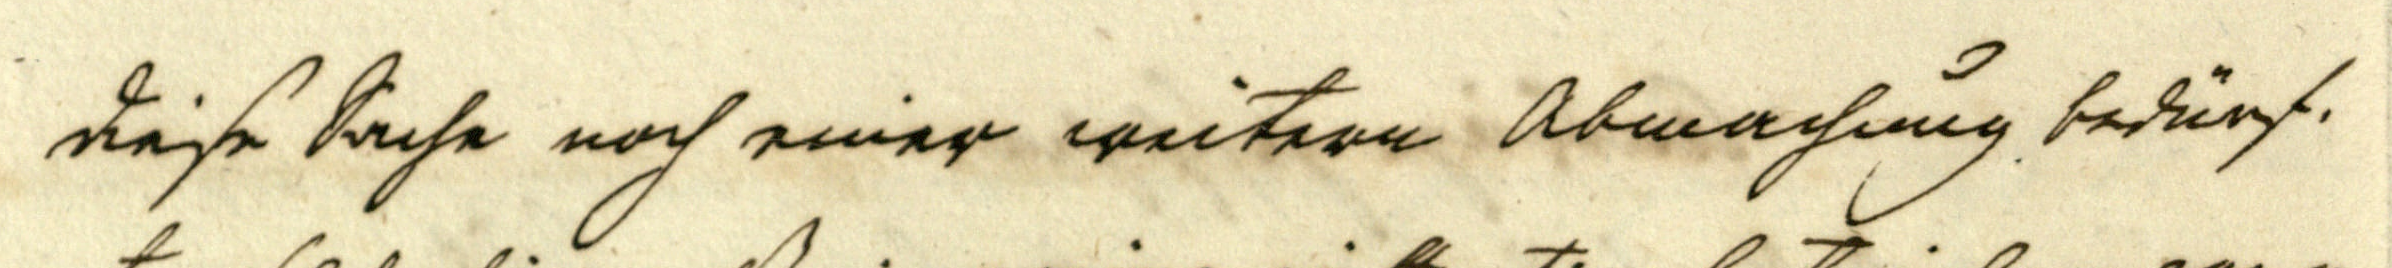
diese Sache noch einer weitern Abmachung bedürf¬
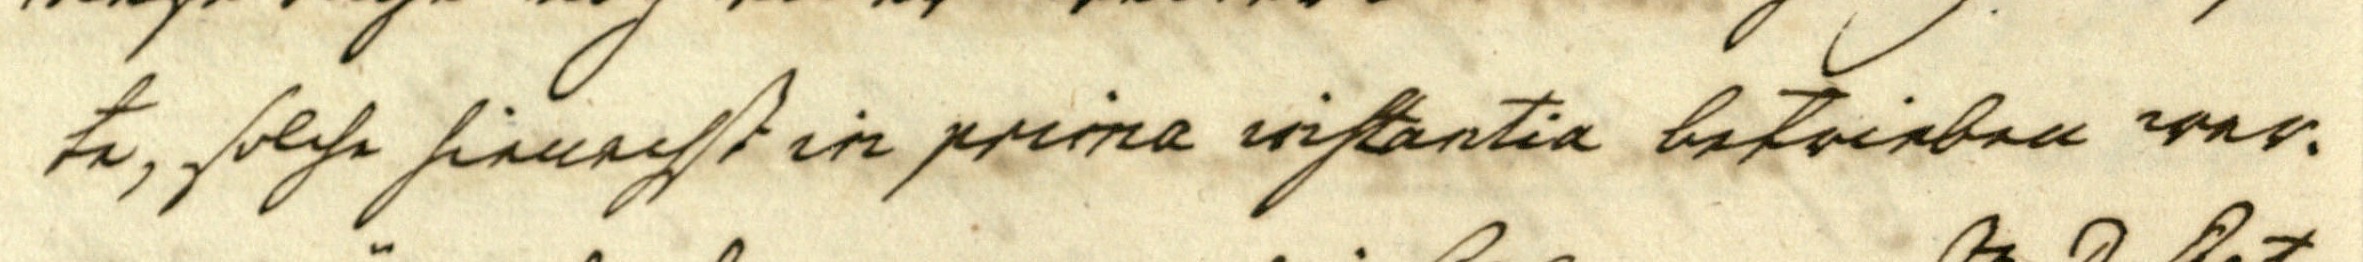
te, solche hienechst in primo instantia betrieben wer¬
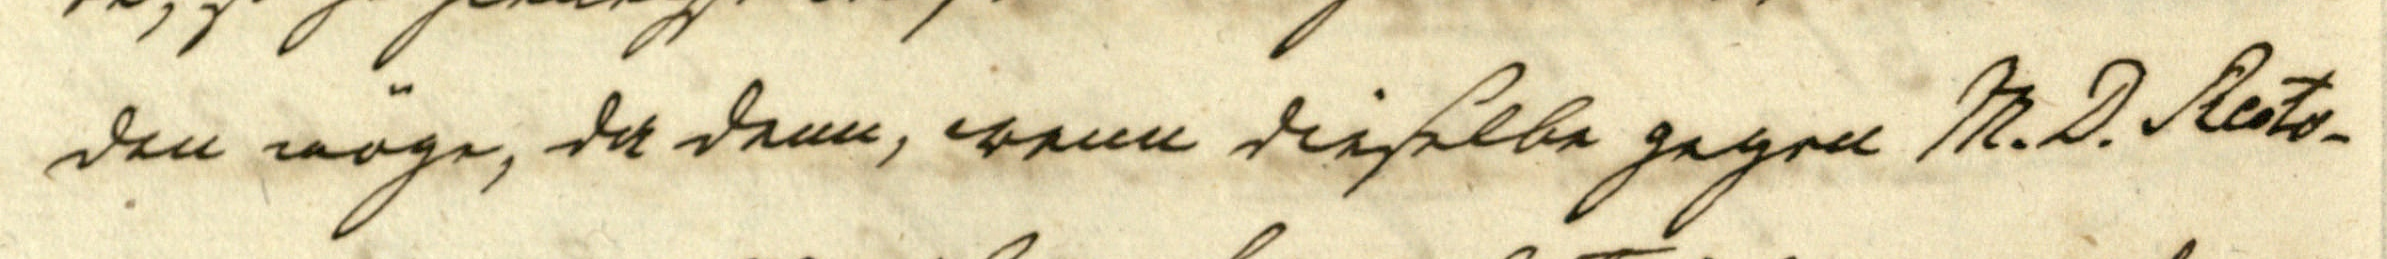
den möge, da denn, wenn dieselbe gegen M. D. Recto¬
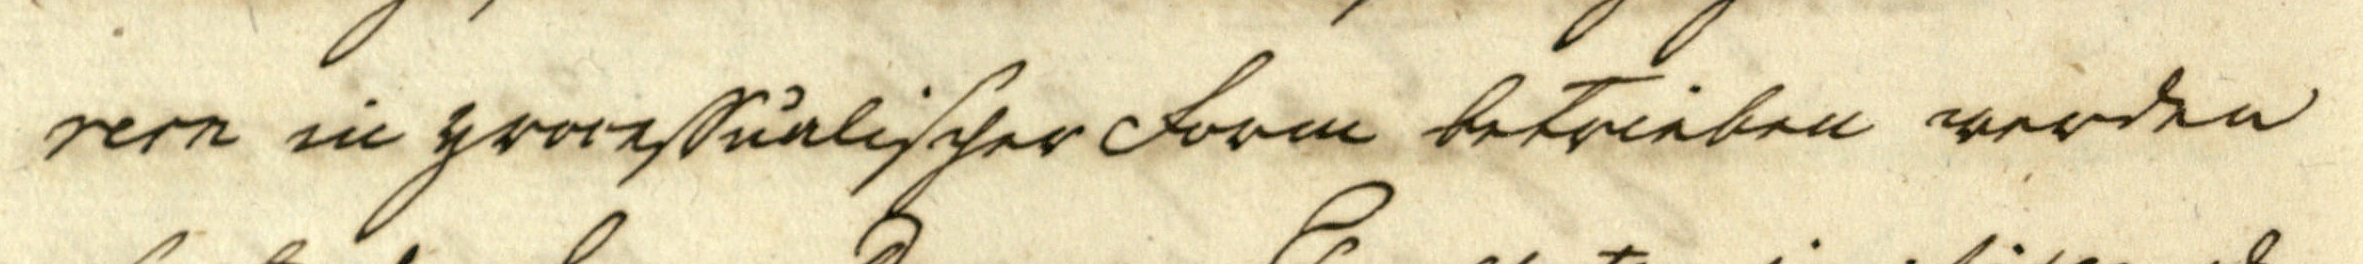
rem in processualischer Form betrieben werden
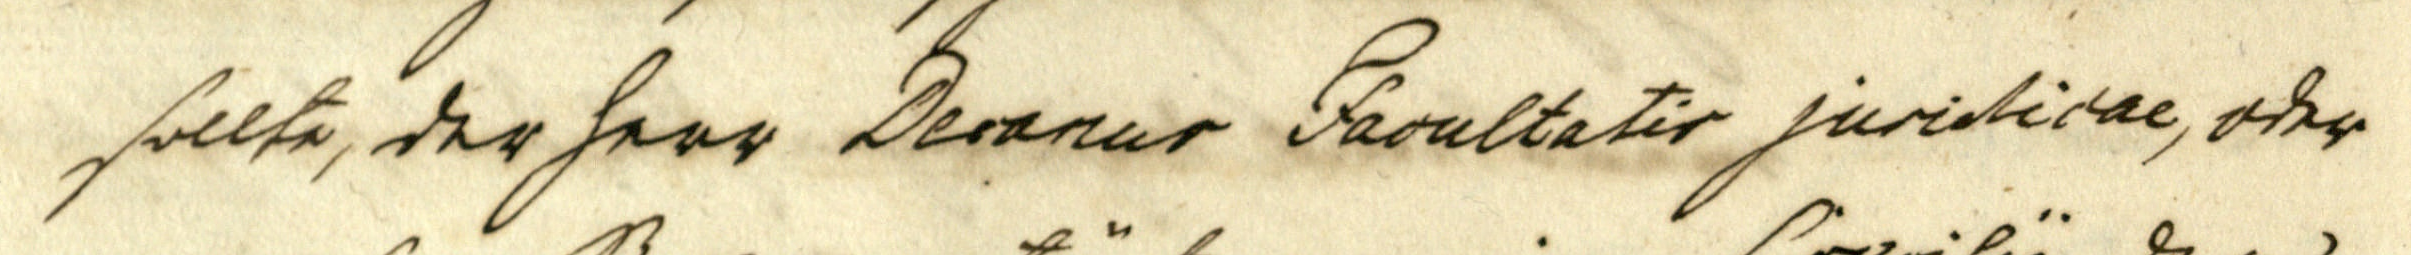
sollte, der Herr Decanus Facultatis juridicae, oder
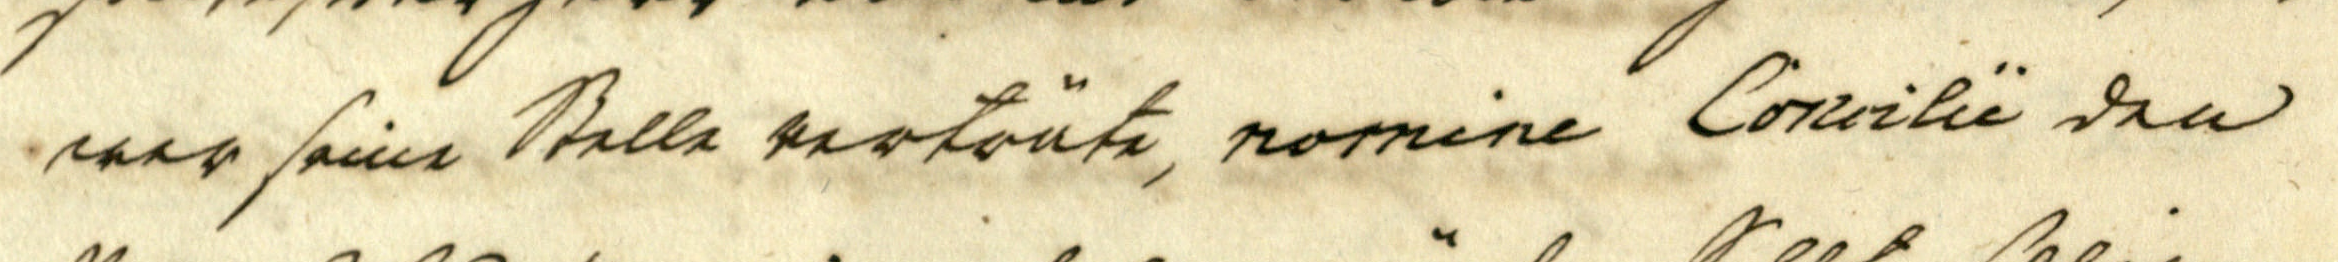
wer seine Stelle verträte, nomine Concilii den
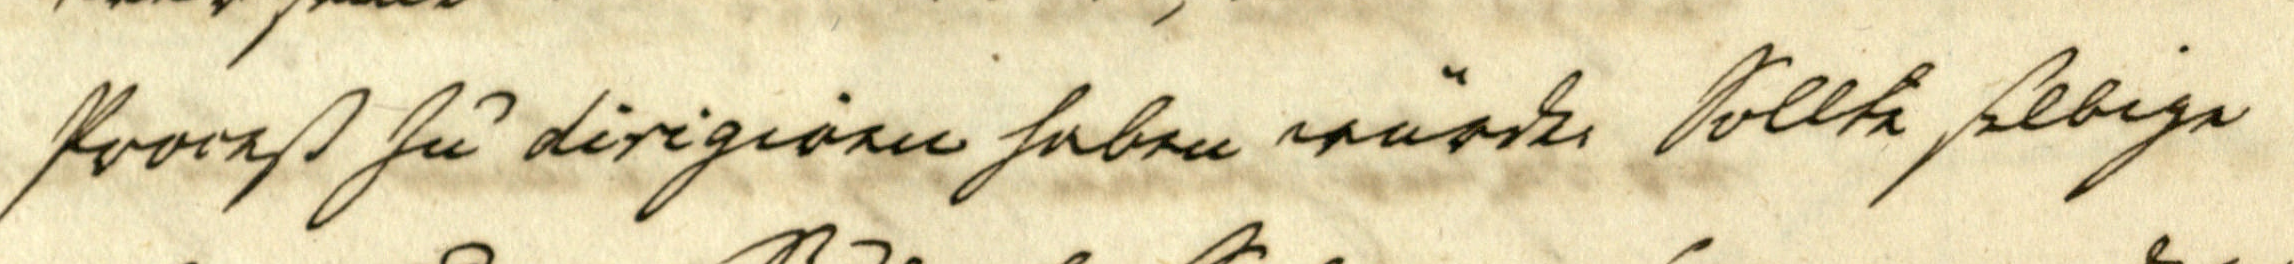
Proceß zu dirigiren haben würde. Sollte selbige
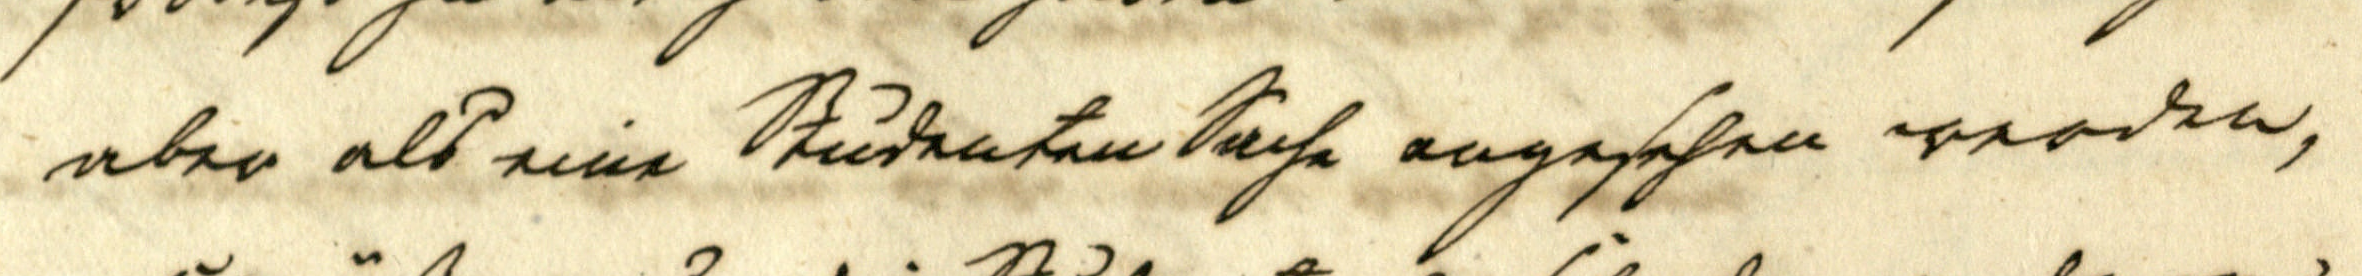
aber als eine Studenten Sache angesehen werden,
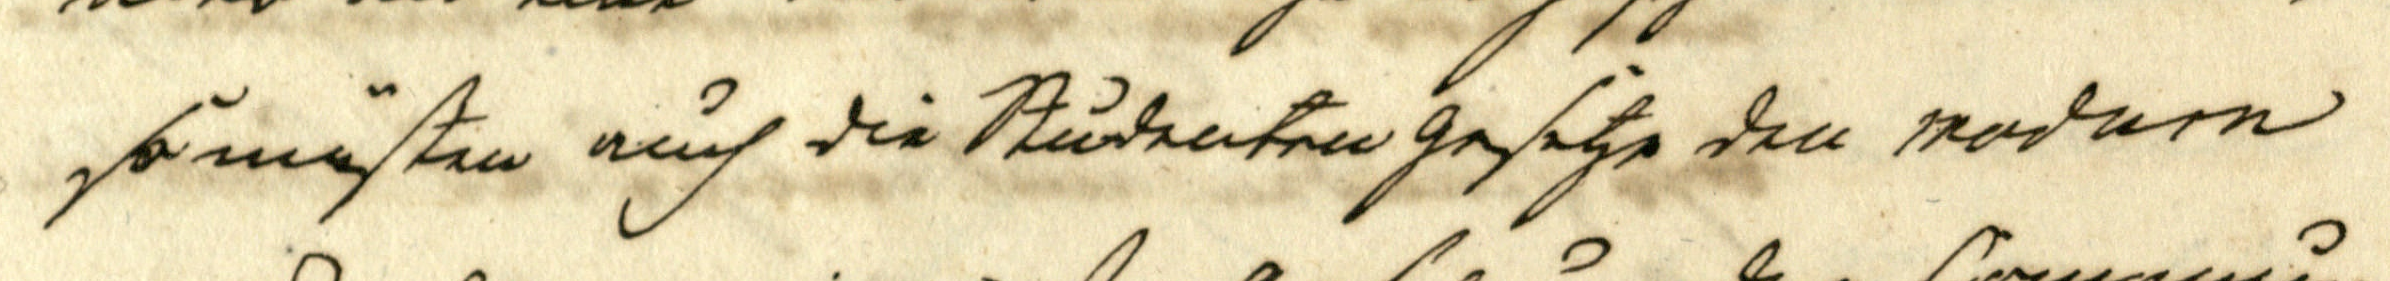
so müsten auch die Studenten Gesetze den modum
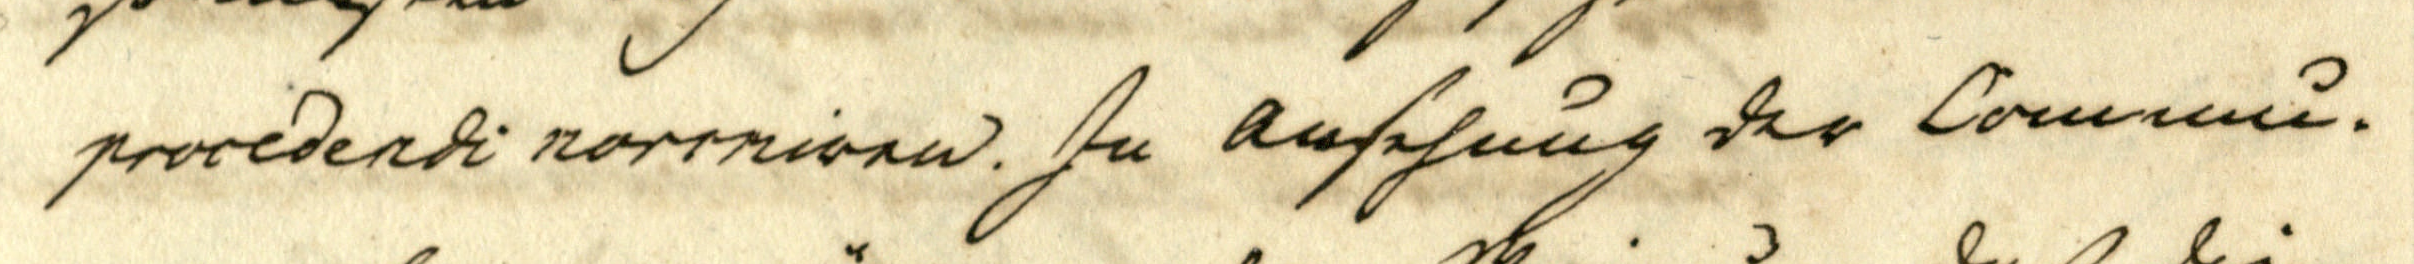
procedendi normiren. In Ansehung der Commu¬
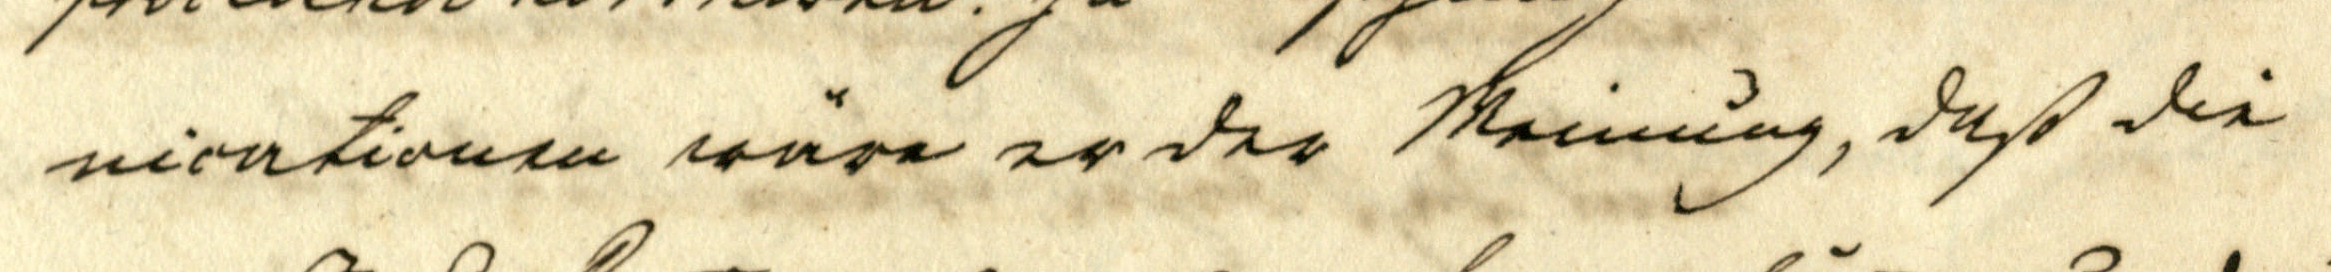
nicationen wäre er der Meinung, daß die
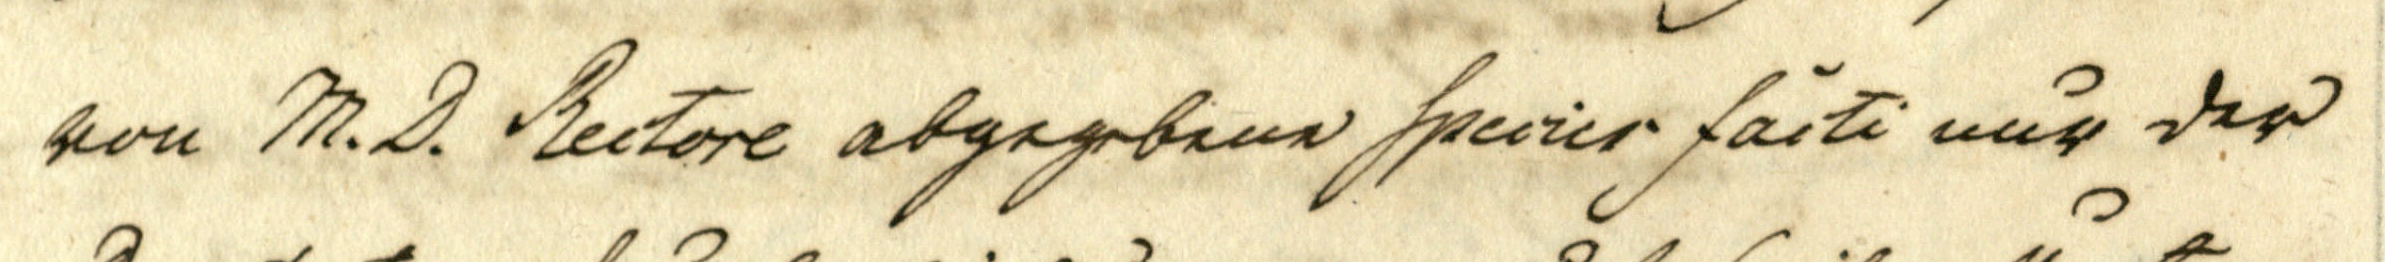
von M. D. Rectore abgegebene species facti nur der
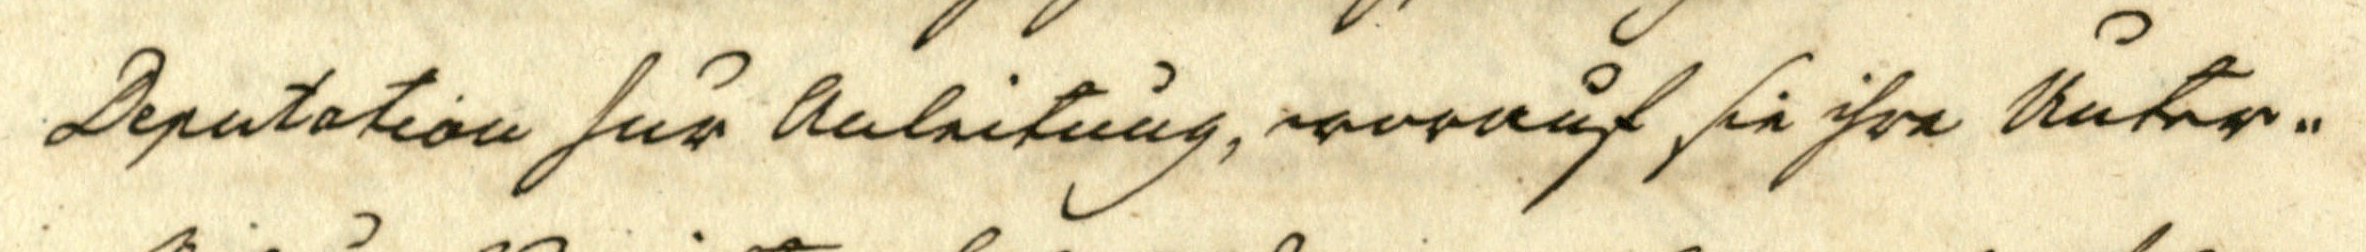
Deputation zur Anleitung, worauf sie ihre Unter¬
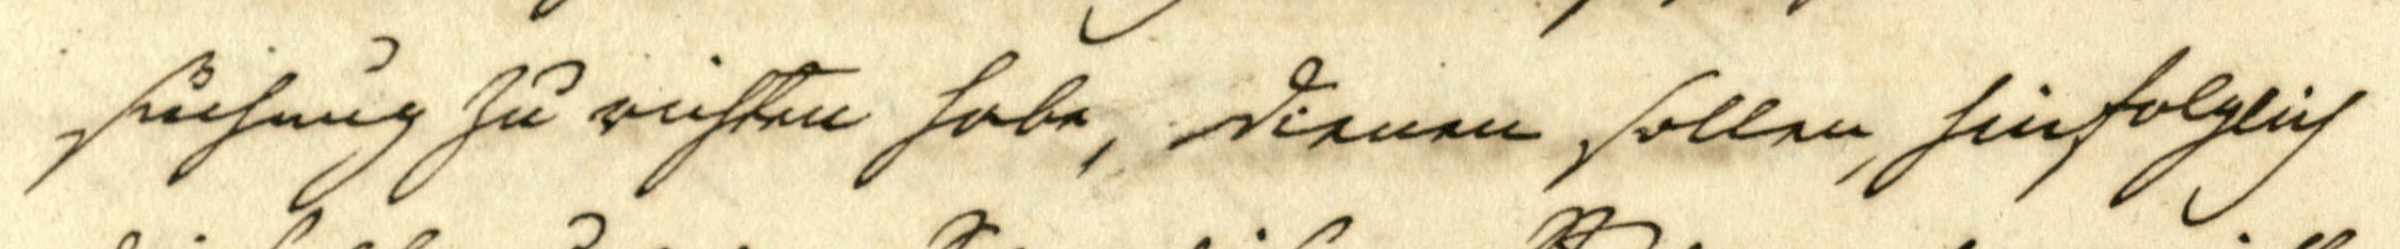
suchung zu richten habe, dienen sollen, hinfolglich
